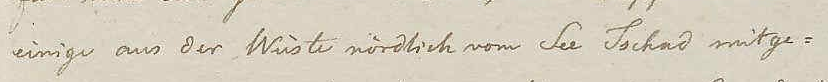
einige aus der Wüste nördlich vom See Tschad mitge-
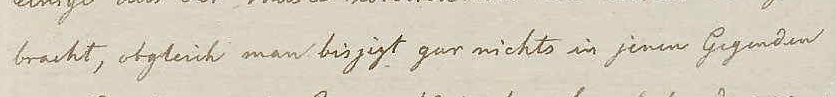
bracht, obgleich man bis jezt gar nichts in jenen Gegenden
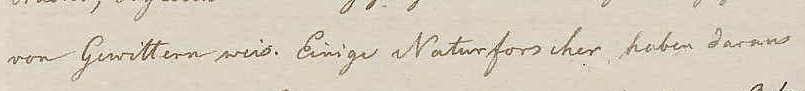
von Gewittern weis. Einige Naturforscher haben daraus
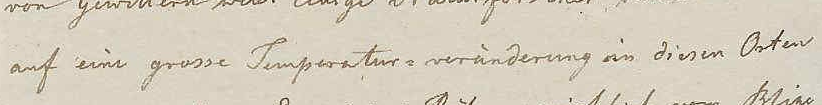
auf eine grosse Temperatur-veränderung in diesen Orten
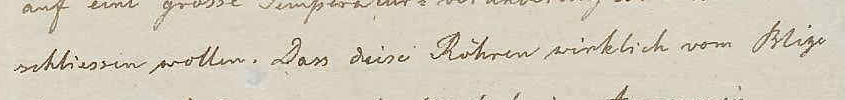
schliessen wollen. Dass diese Röhren wirklich vom Blize
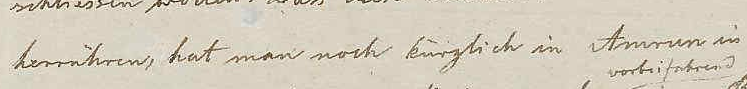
herrühren, hat man noch kürzlich in Amrun in
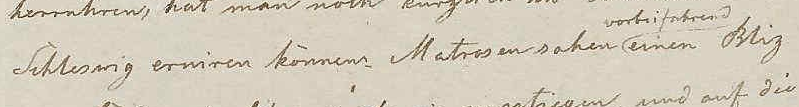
Schleswig eruiren können. Matrosen sahen vorbeifahrend einen Bliz
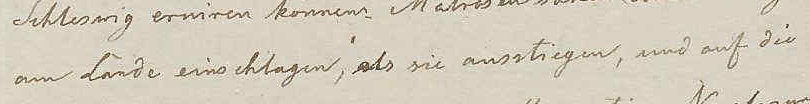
am Lande einschlagen, als sie ausstiegen, und auf die
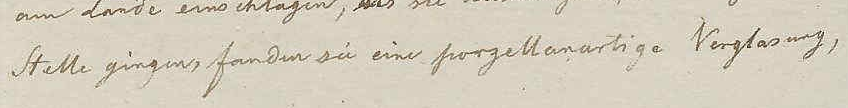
Stelle gingen, fanden sie eine porzellanartige Verglasung,
